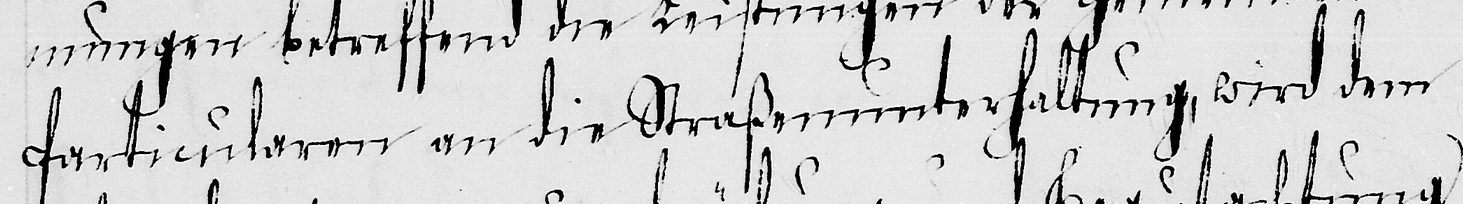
Particularen an die Straßenunterhaltung, wird dem
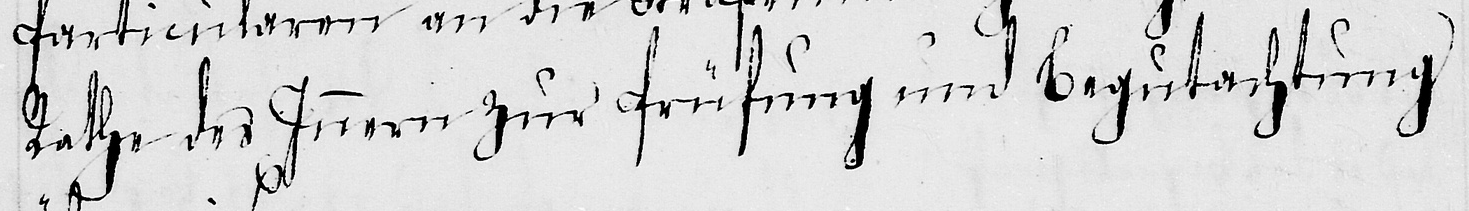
Rathe des Innern zur Prüfung und Begutachtung
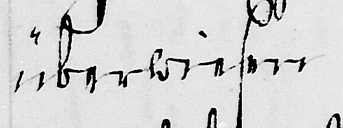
überwiesen.
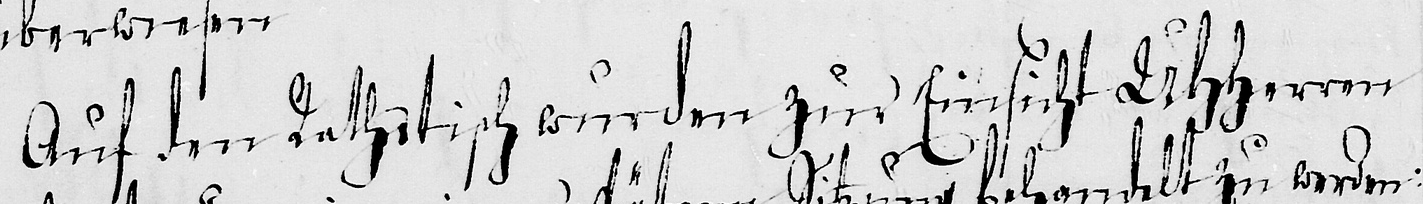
Auf den Rathstisch wurden zur Einsicht UHHerren
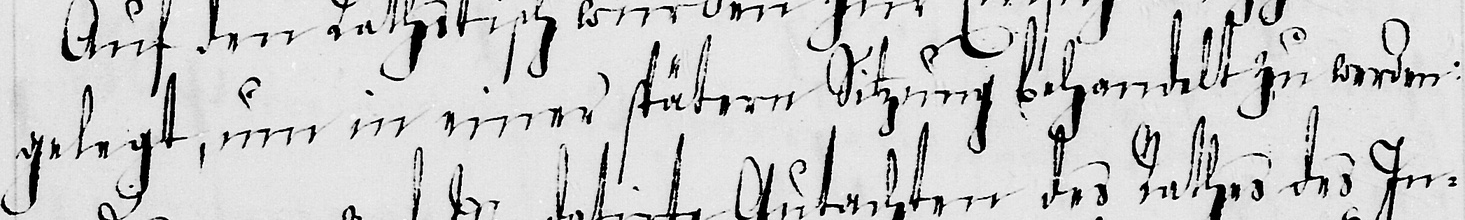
gelegt, um in einer spätern Sitzung behandelt zu werden:
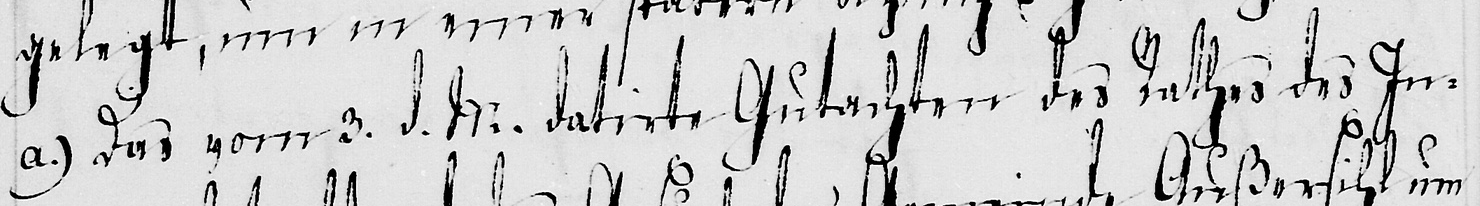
a.) Das vom 3. d. M. datirte Gutachten des Rathes des In¬
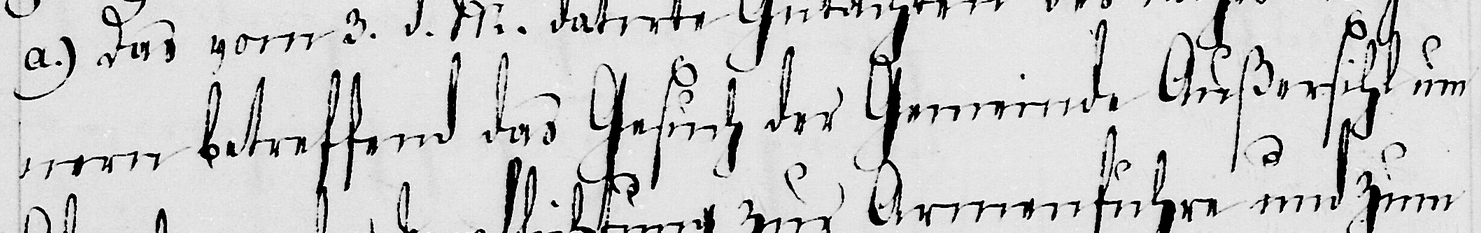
nern betreffend das Gesuch der Gemeinde Außersihl um
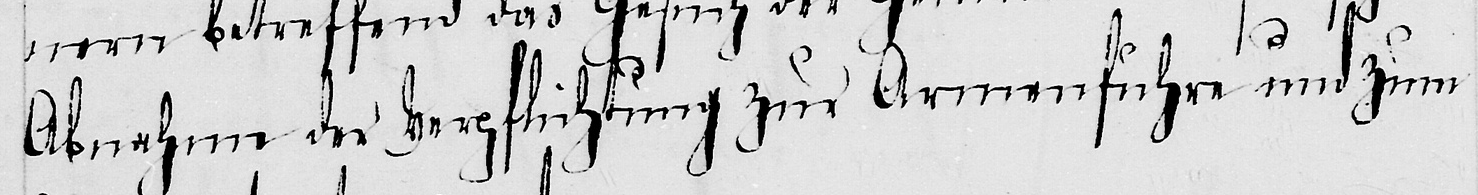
Abnahme der Verpflichtung zur Armenfuhre und zum
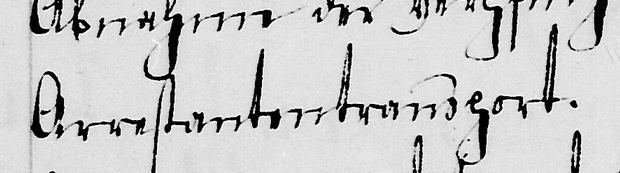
Arrestantentransport.
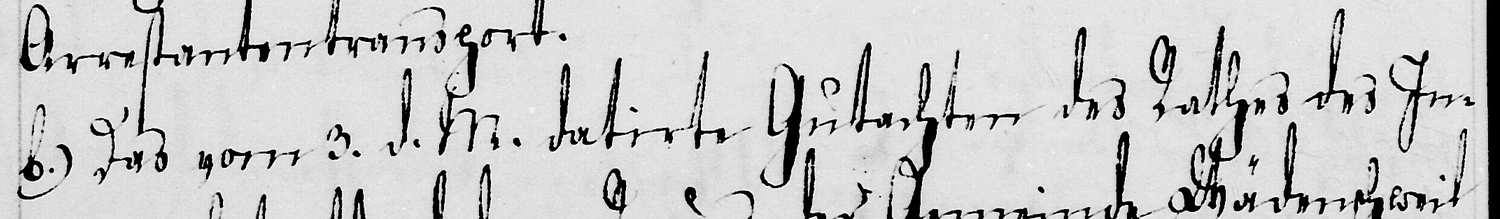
b.) Das vom 3. d. M. datirte Gutachten des Rathes des In¬
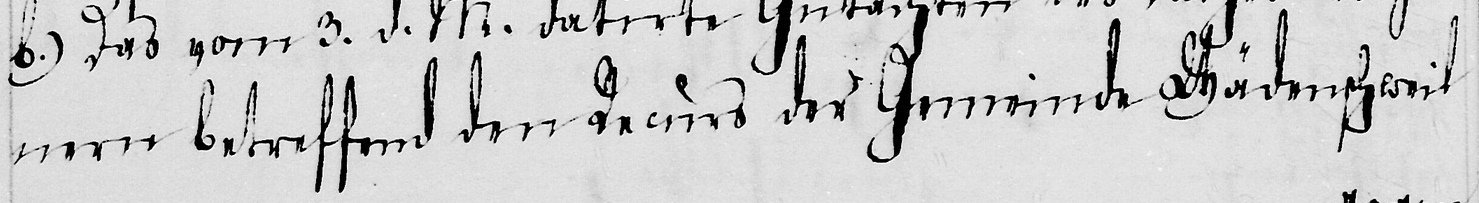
nern betreffend den Recurs der Gemeinde Wädenschweil
